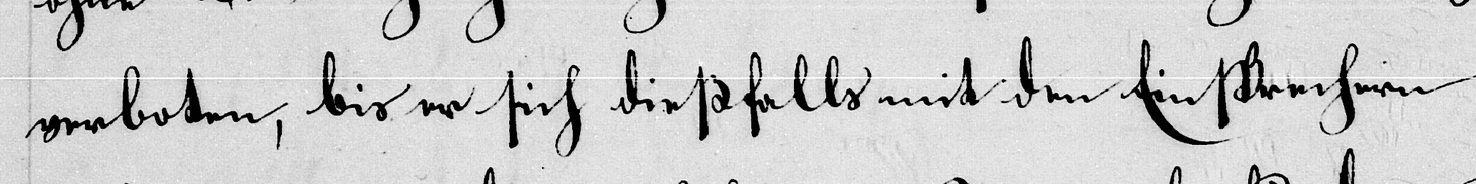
verboten, bis er sich dießfalls mit den Einsprechern
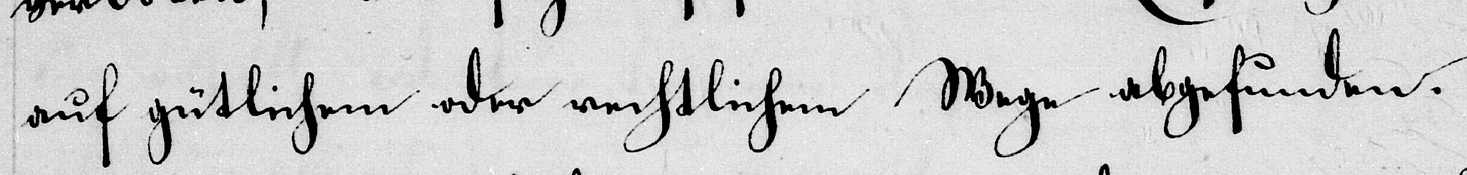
auf gütlichem oder rechtlichem Wege abgefunden.
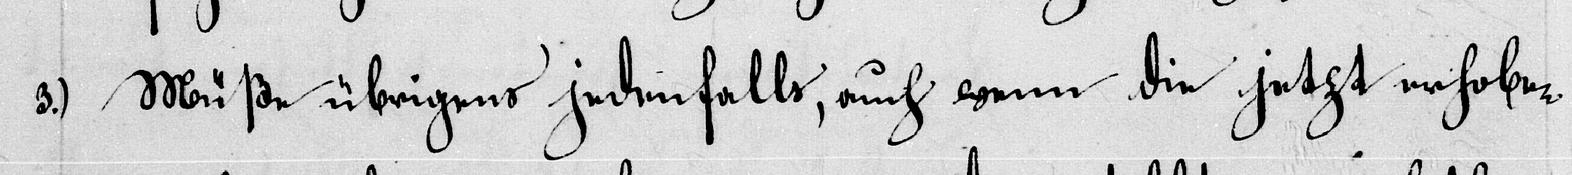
3.) Müße übrigens jedenfalls, auch wenn die jetzt erhobe¬
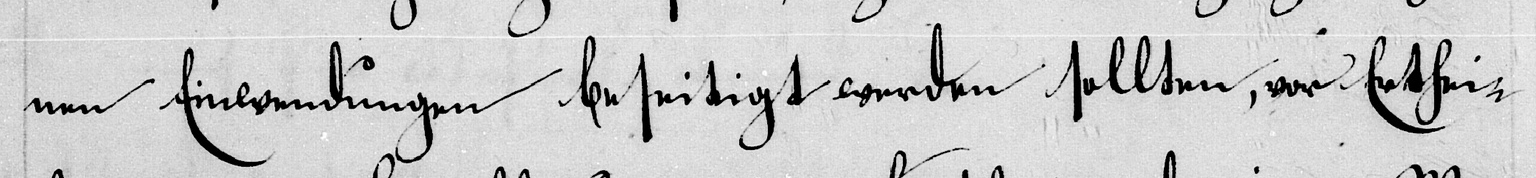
nen Einwendungen beseitigt werden sollten, vor Erthei¬
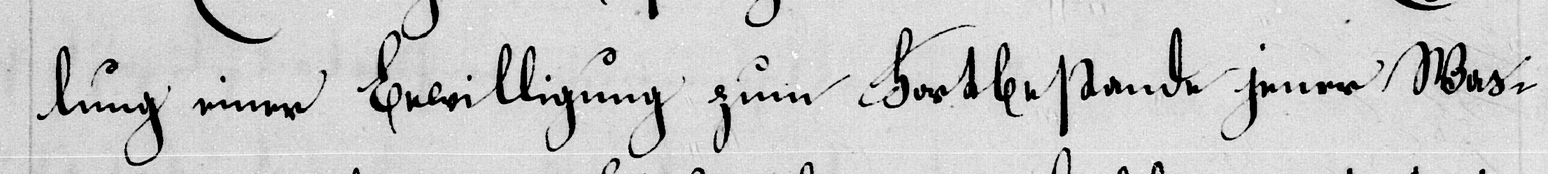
lung einer Bewilligung zum Fortbestande jener Waß¬
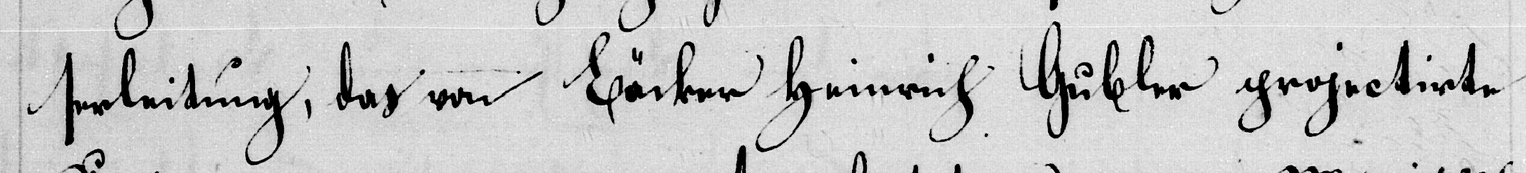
erleitung, das von Bäcker Heinrich Gubler projectirte
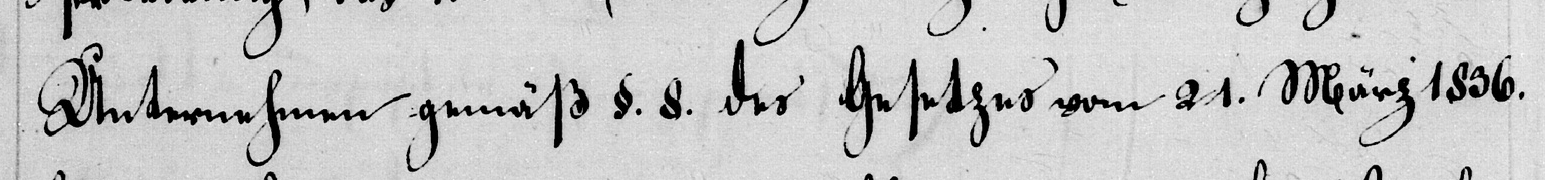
Unternehmen gemäß §.8. des Gesetzes vom 21. März 1836.
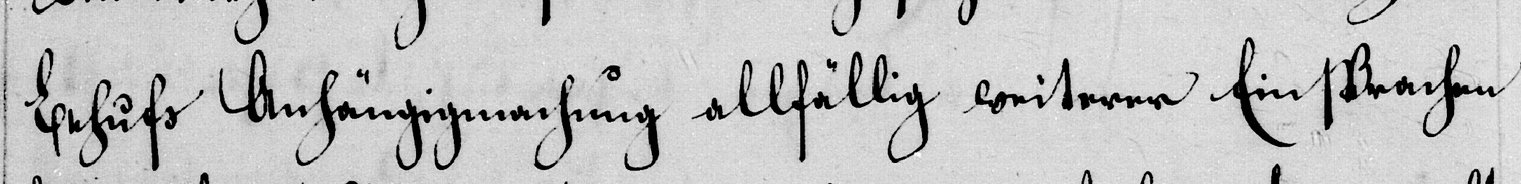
Behufs Anhängigmachung allfällig weiterer Einsprachen
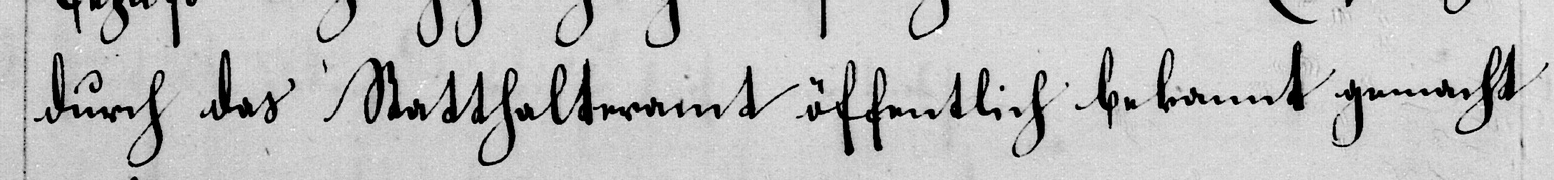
durch das Statthalteramt öffentlich bekannt gemacht
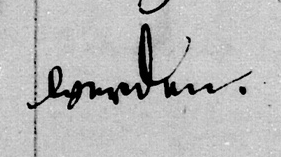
werden.
